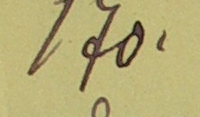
170
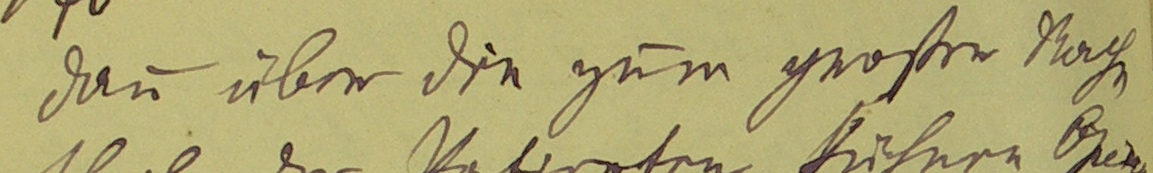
dann über die zum großen Nach¬
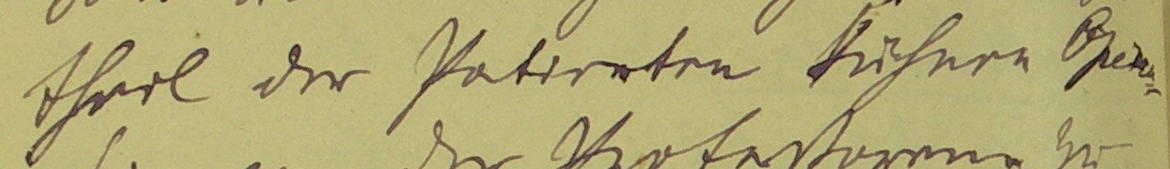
theil der Patienten kühnen Opera¬
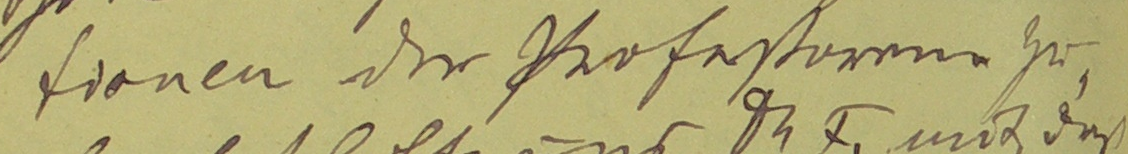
tionen der Profeßoren. Zu¬
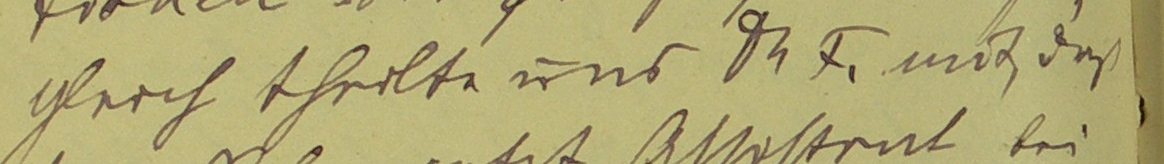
gleich theilte uns Dr. F. mit, daß
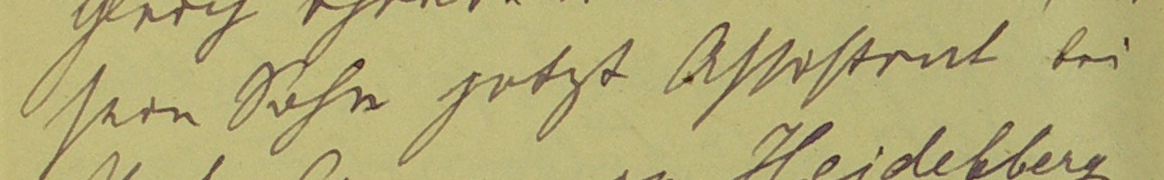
sein Sohn jetzt Assistent bei
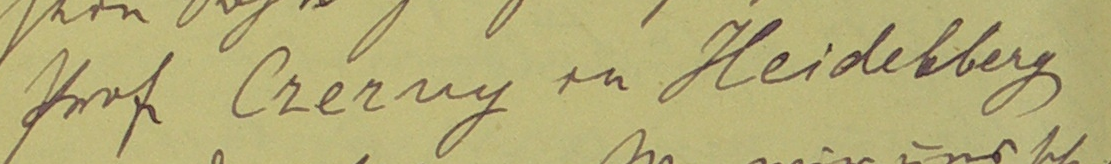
Prof. ??? in ???
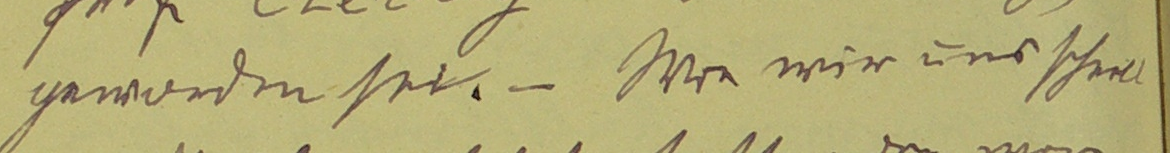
geworden sei.- Wie wir uns schnell
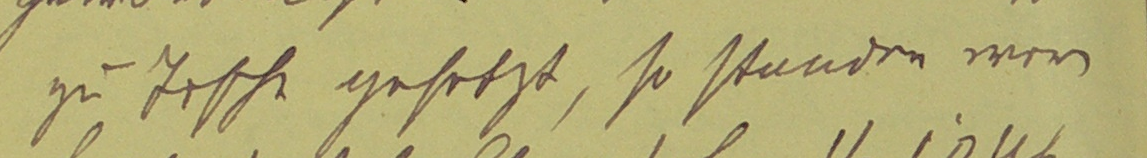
zu Tische gesetzt, so standen wir
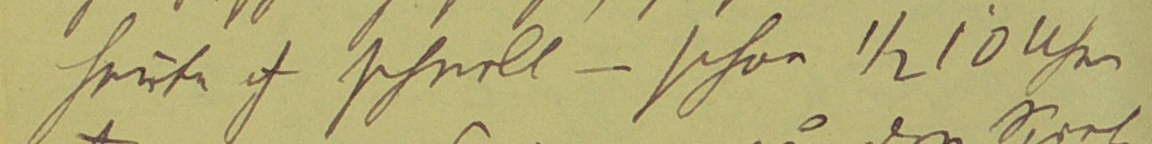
heute ch schnell.- schon ½ 10 Uhr
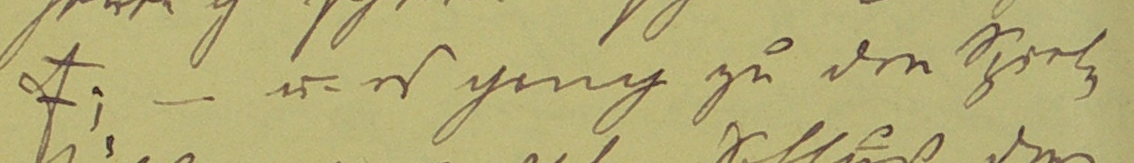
f,- und es ging zu den Spiel¬
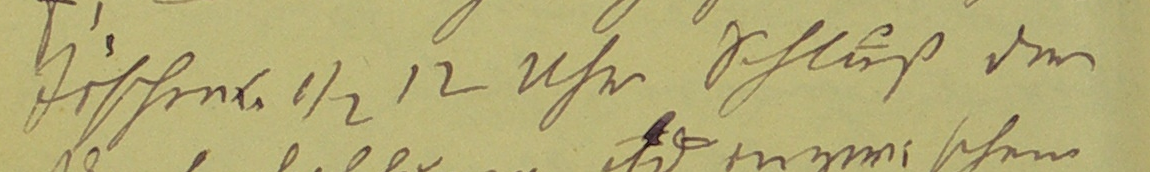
tischen. ½ 12 Uhr Schluß der
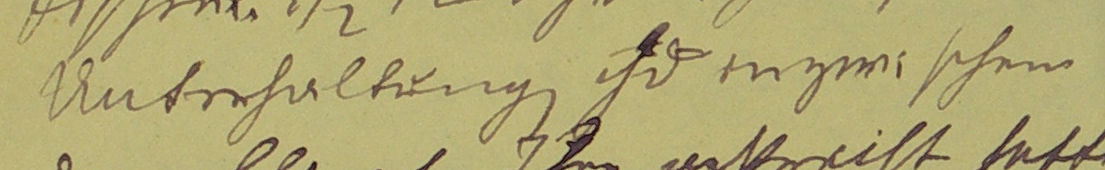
Unterhaltung, chd inzwischen
